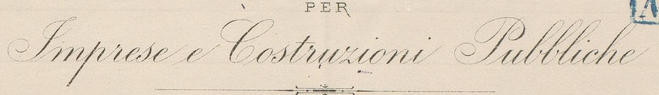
Imprese e Costruzioni Pubbliche
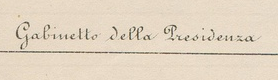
Gabinetto della Presidenza
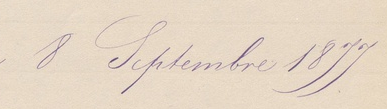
8 Septembre 1877
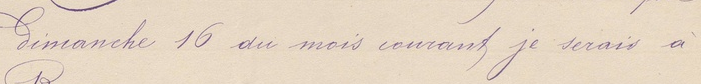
dimanche 16 du mois courant je serais à
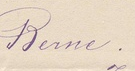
Berne.
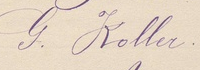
G. Koller.
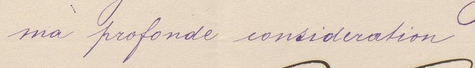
ma profonde consideration
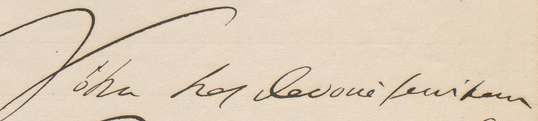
Votre tres devouè serviteur
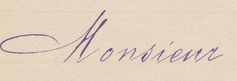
Monsieur
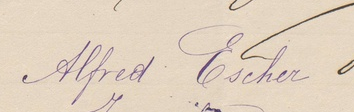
Alfred Escher
